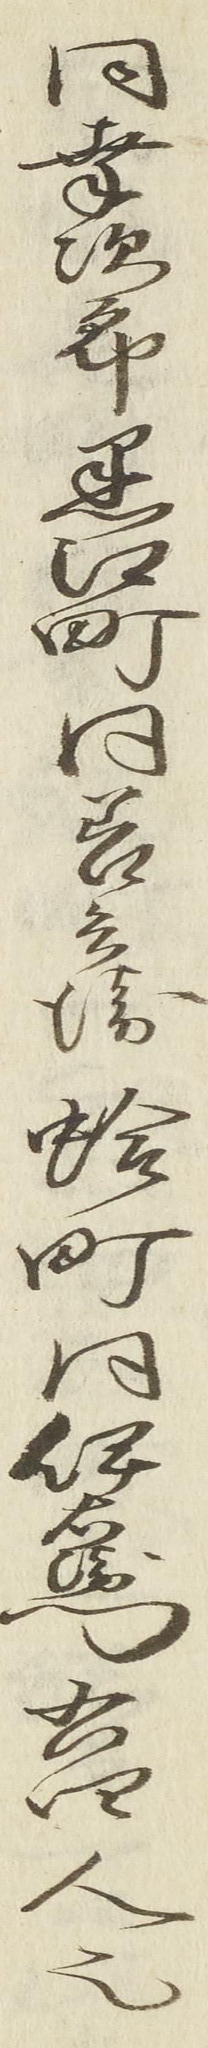同幸次郎黒江町同善兵衛蛤町同伊右衛門右四人也
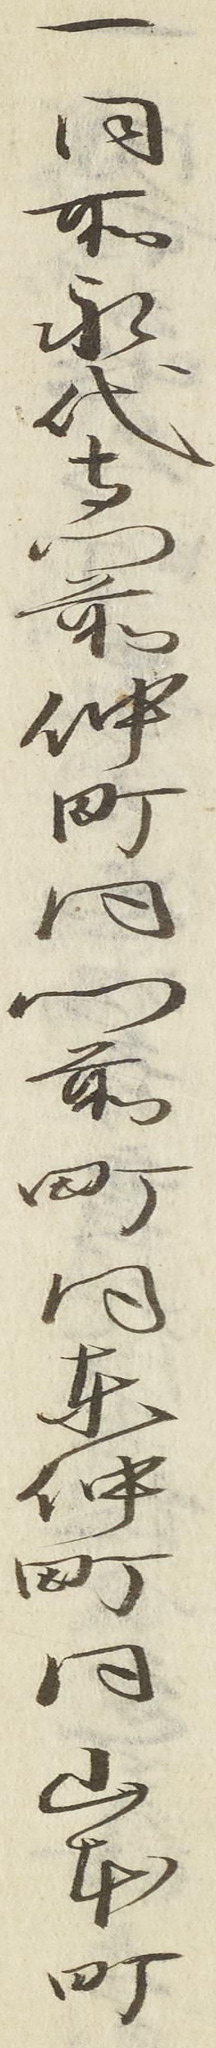一同所永代寺門前仲町同門前町同東仲町同山本町
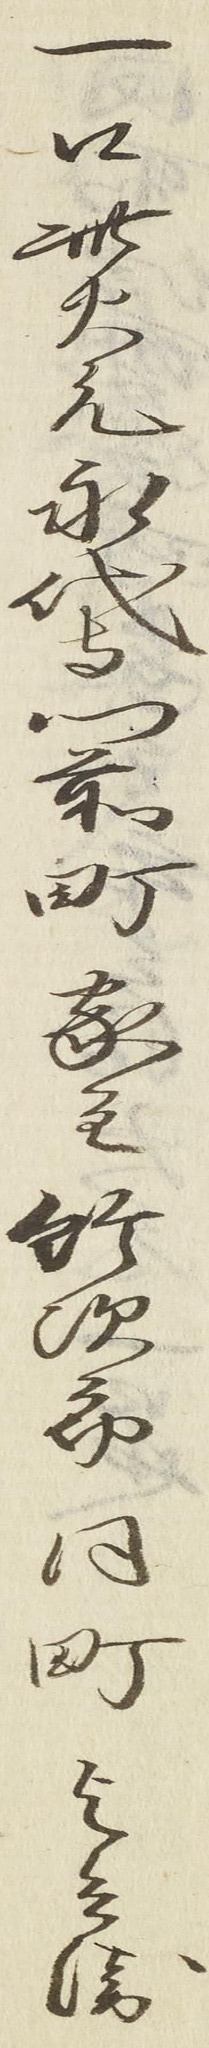一口此火元永代寺門前町家主竹次郎同町与兵衛
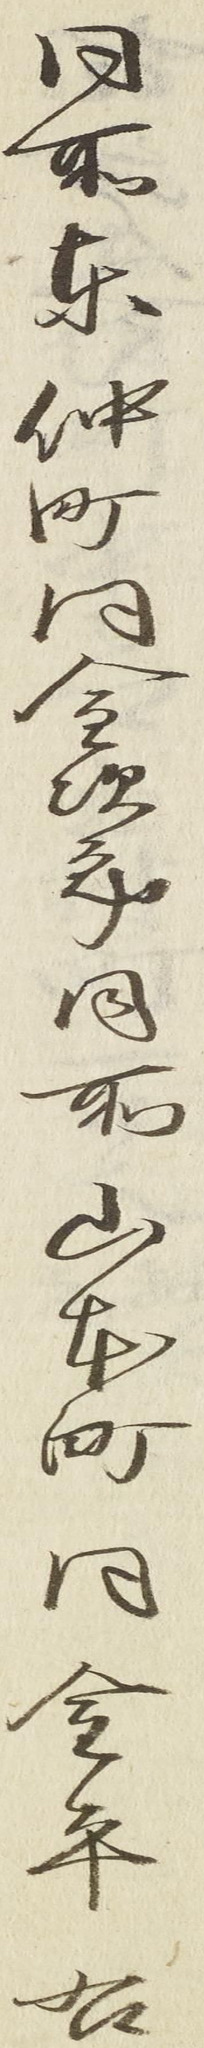同所東仲町同金次郎同所山本町同金平右
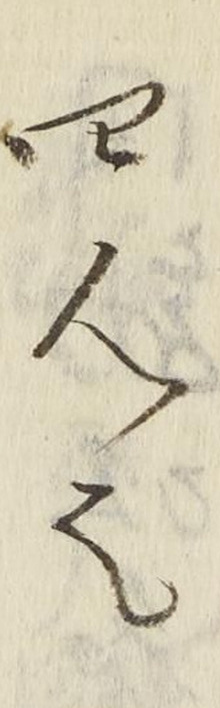四人也
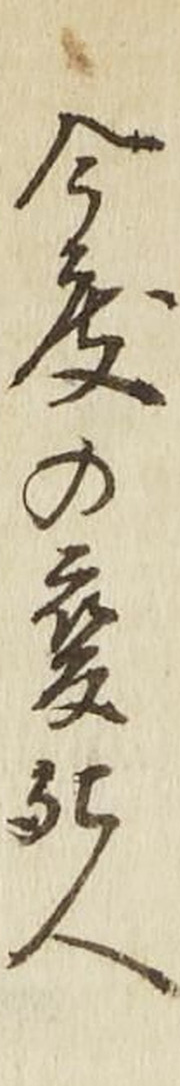今度の変死人
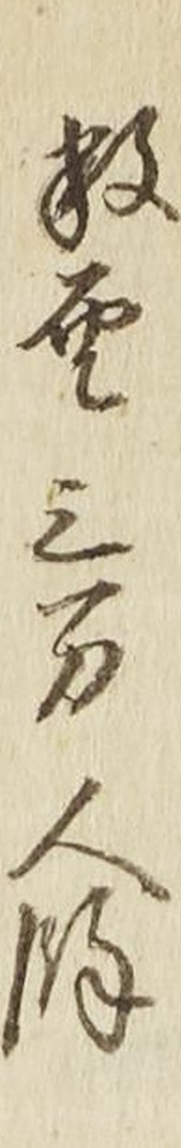数届三万人余
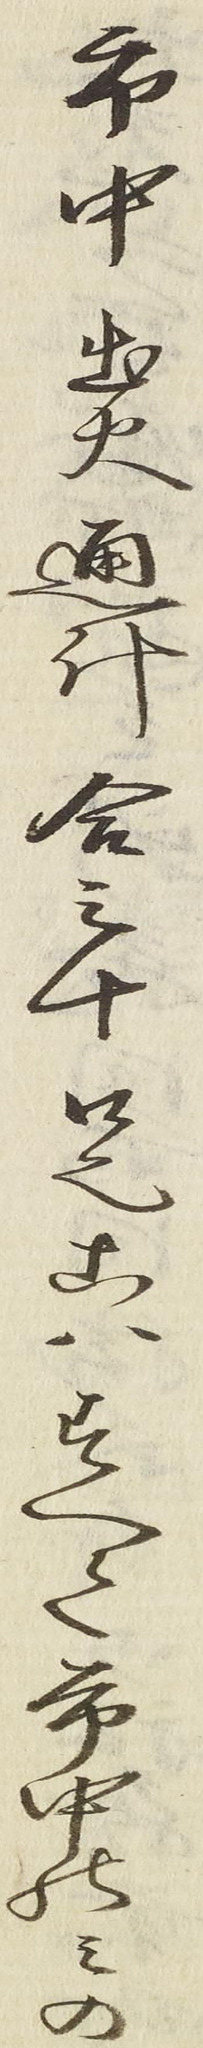市中出火通計合三千口也こはすへて市中のみの
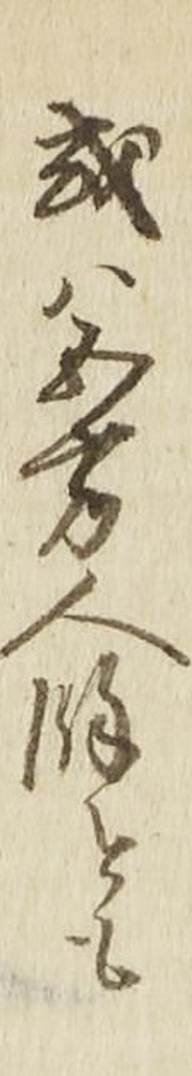或は五万人余とも
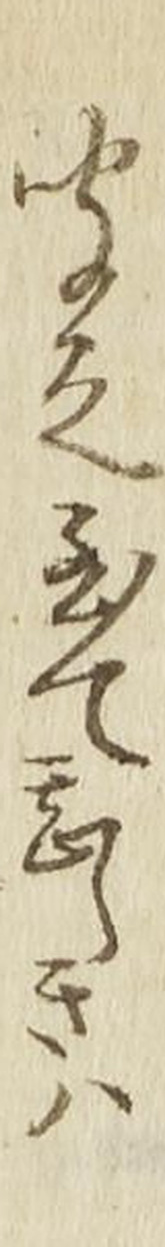聞え至て甚しきは
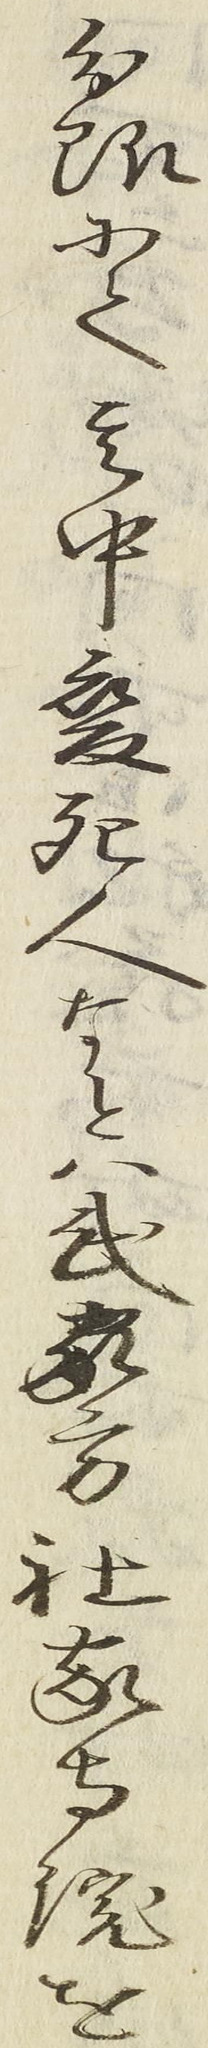分限にて其中変死人なとは武家方社家寺院を
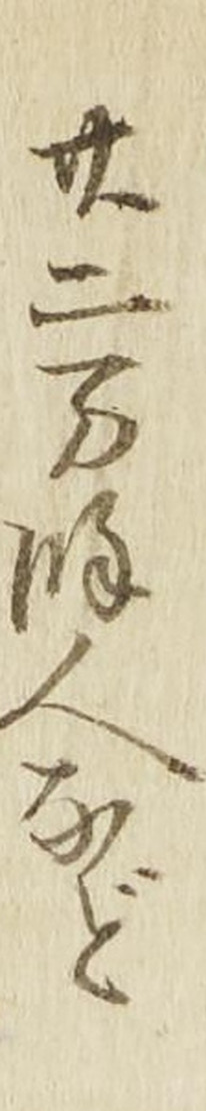廿二万余人など
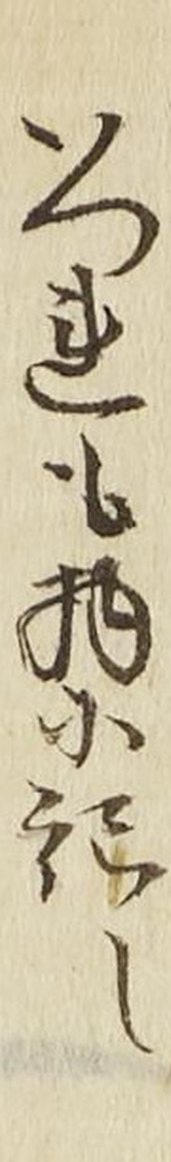いつれも物に記し
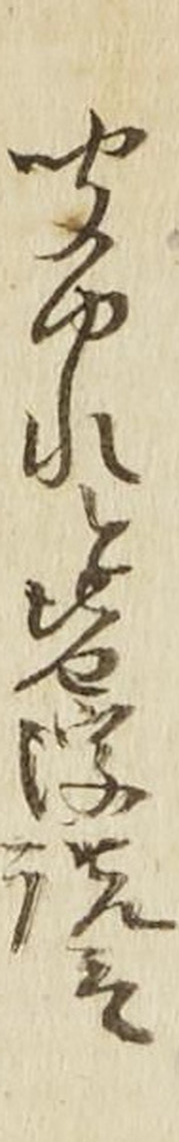聞ゆれと皆浮説にて
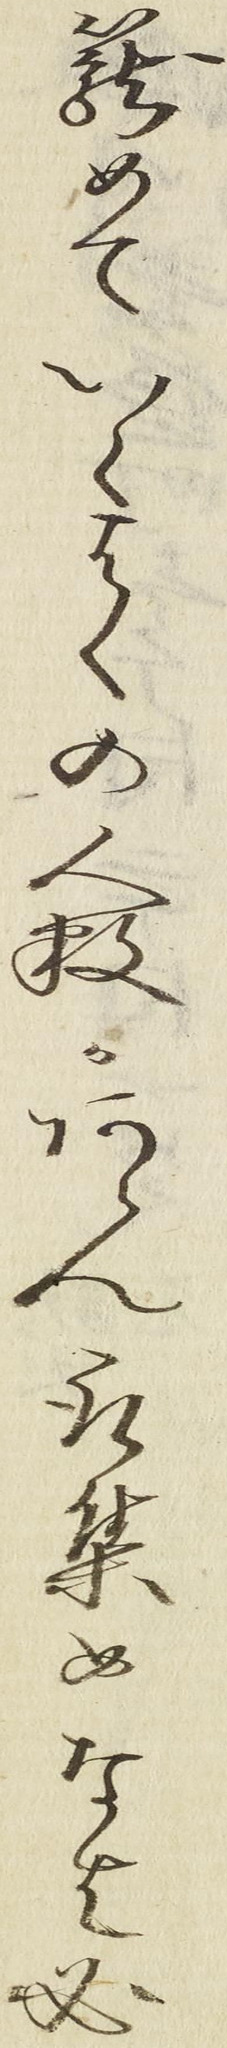籠めていくはくの人数かあらん取集めなは必
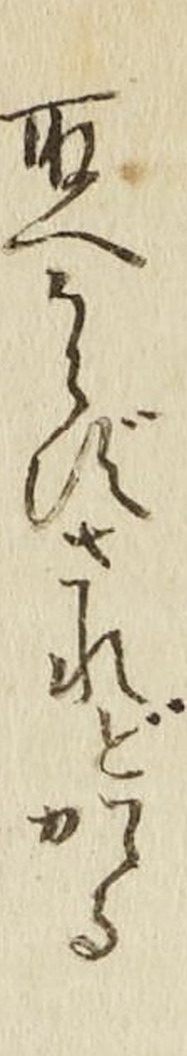取へからずされどかゝる
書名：やぶれ窓の記　全
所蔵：東京大学地震研究所図書室 Earthquake Research Institute Library, The University of Tokyo, JAPAN
